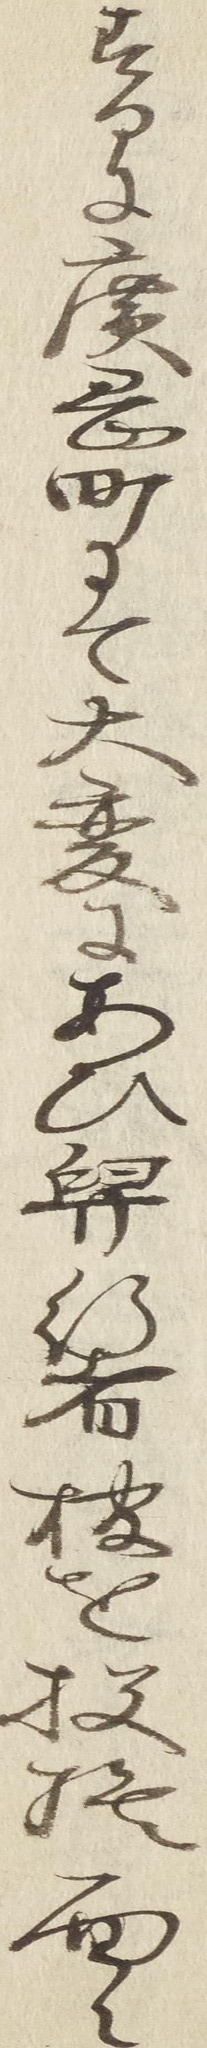るに広岡町にて大変にあひ舁行者棺を投捨面々
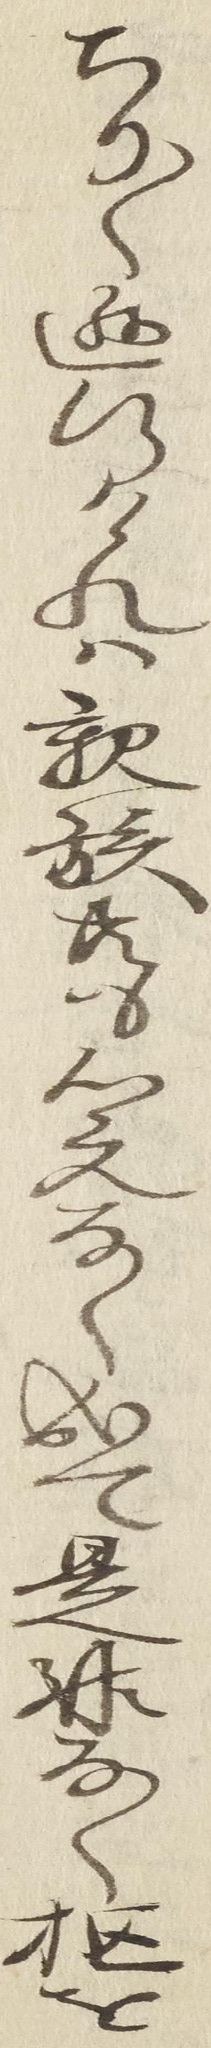ちり〳〵逃行けれは親族共も心元なく成て是非なく枢を
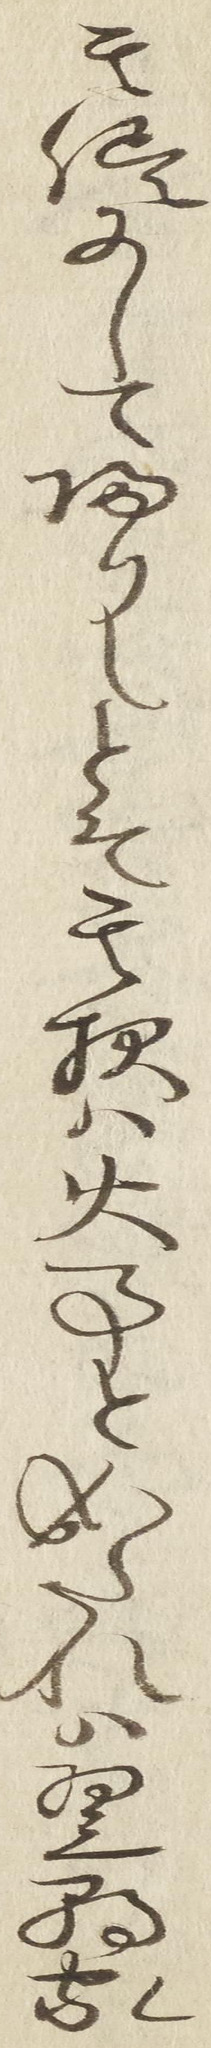其侭にして帰りしとそ其夜は火事と成たれは翌朝家
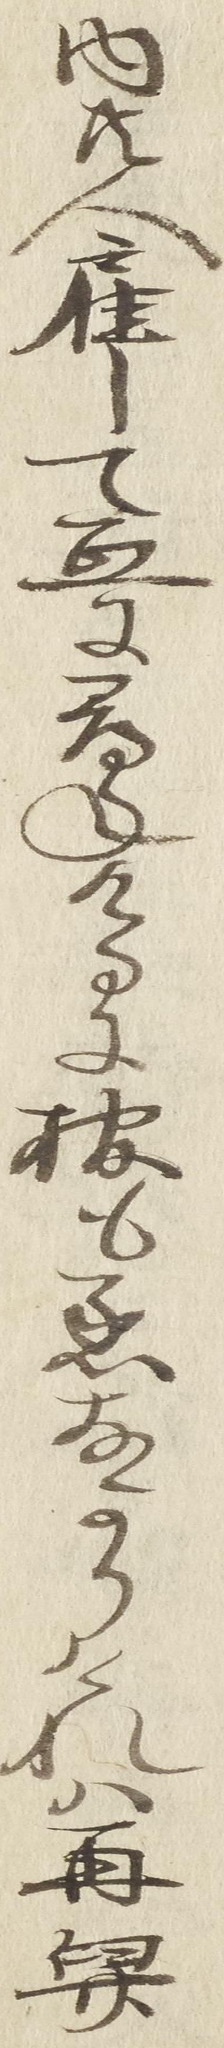内共人雇して互に尋ねけるに棺も蒸なかりけれは再舁
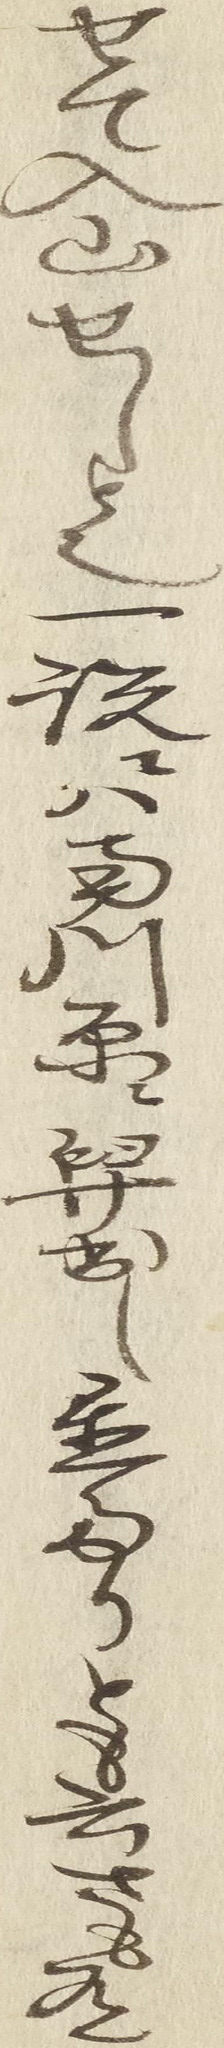せて入山せしと也一説には南川原に舁出し置たりとも云さも有
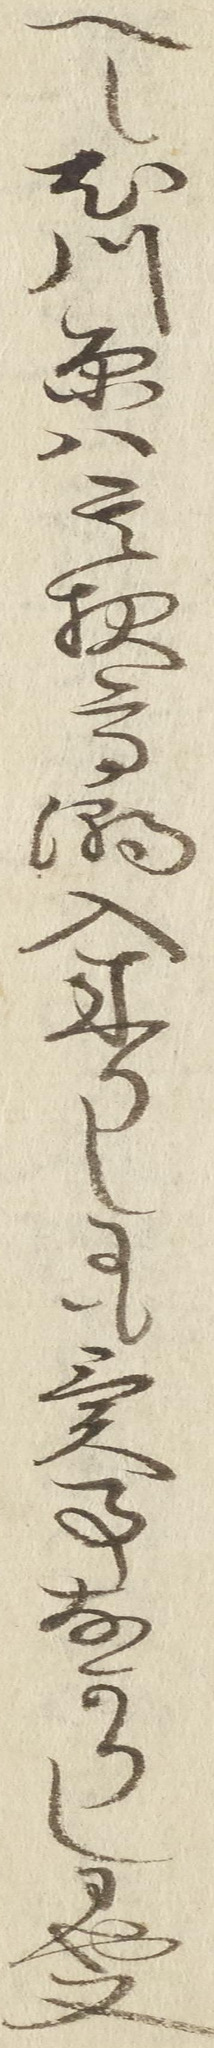へし尤川原は其夜高潮入来りしにも実事なかりしにや又
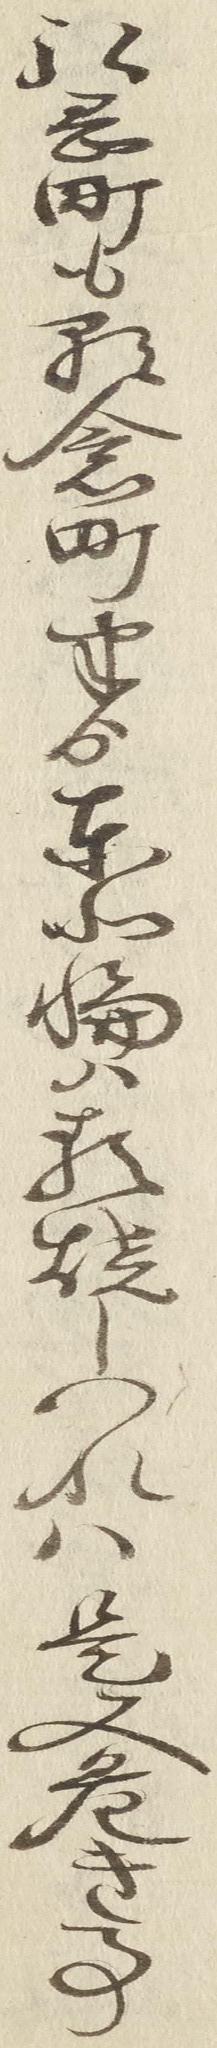弘岡町も朝倉町半分より東北輪は類焼しつれは是又危き事
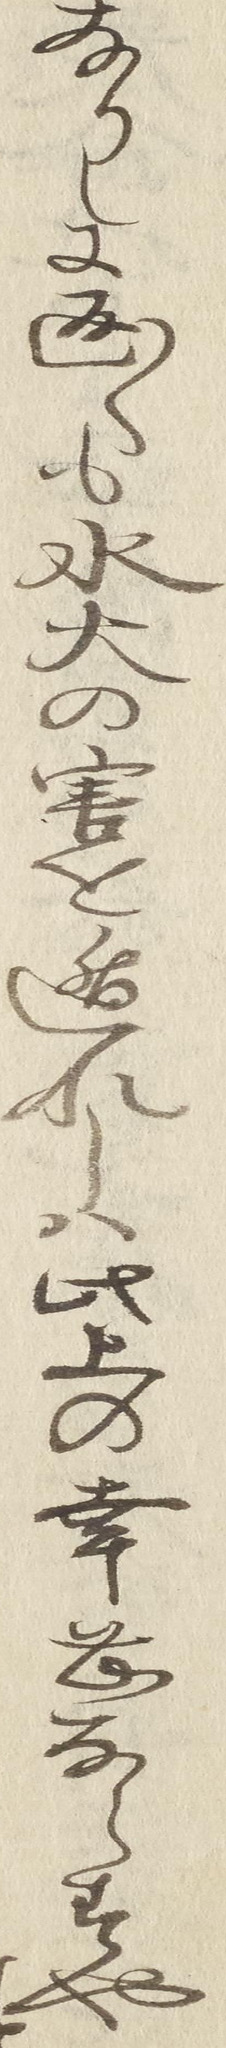なりしに返々も水火の害を遁れしは此上の幸甚ならすやと
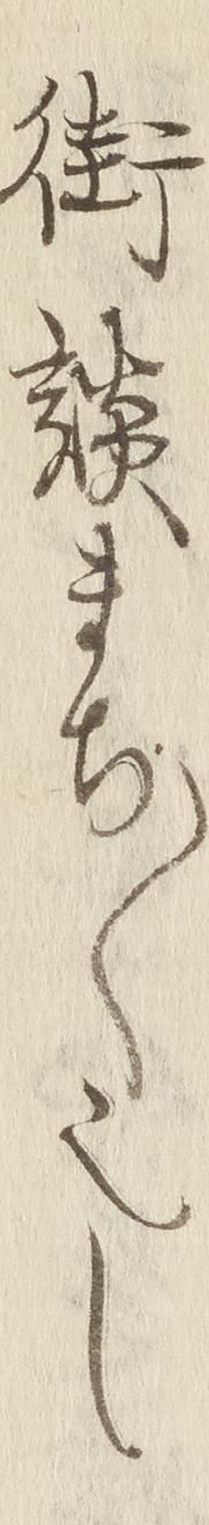街談まち〳〵也し
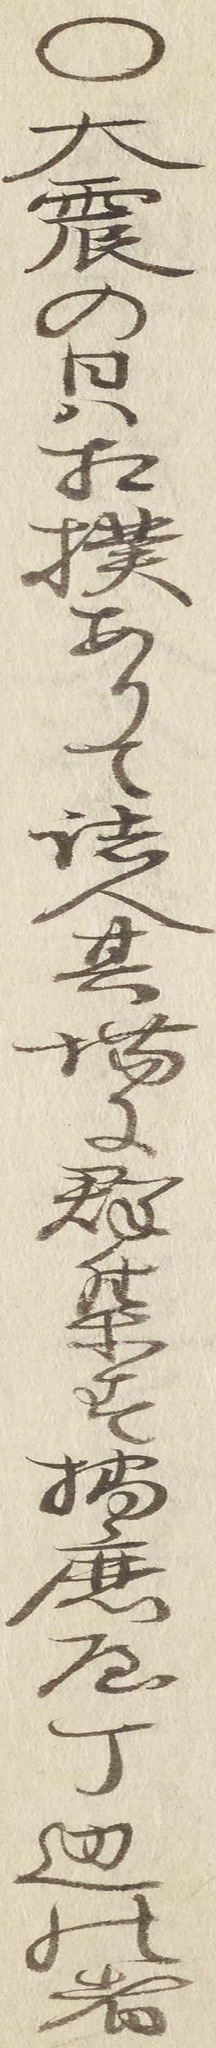〇大震の日は相撲ありて諸人其場に群集す播磨屋丁辺の者
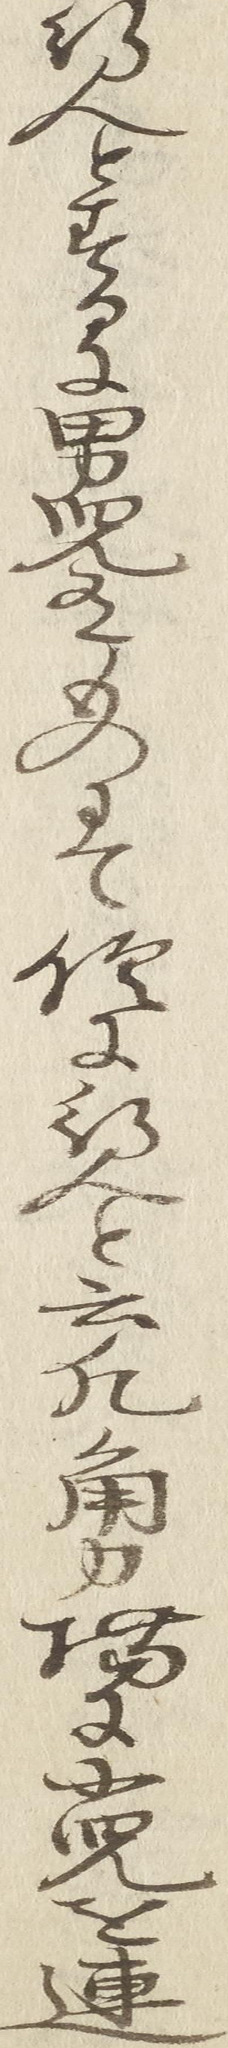行人とするに男児有ものにて侭に行人と云凡角力場に小児を連
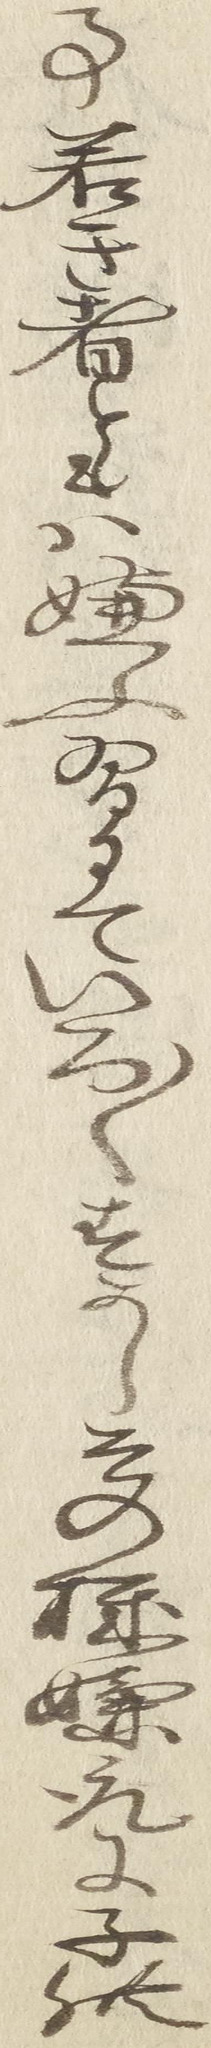事若き者ともは嫌ふ習にていろ〳〵すかし機嫌取に子供
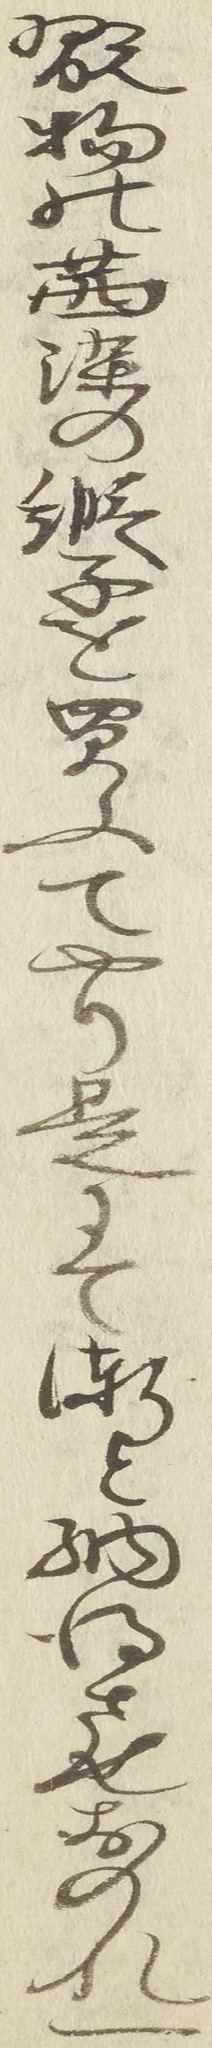翫物の茜深の緞子を買ふてやり是にて漸と納得させおのれ一
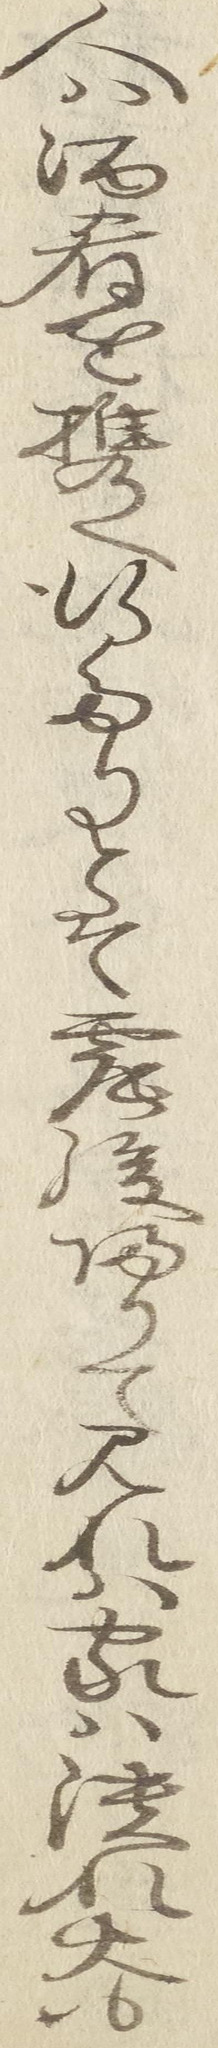人は酒肴を携へ得たりとて震後帰りて見れは家は潰れ火も
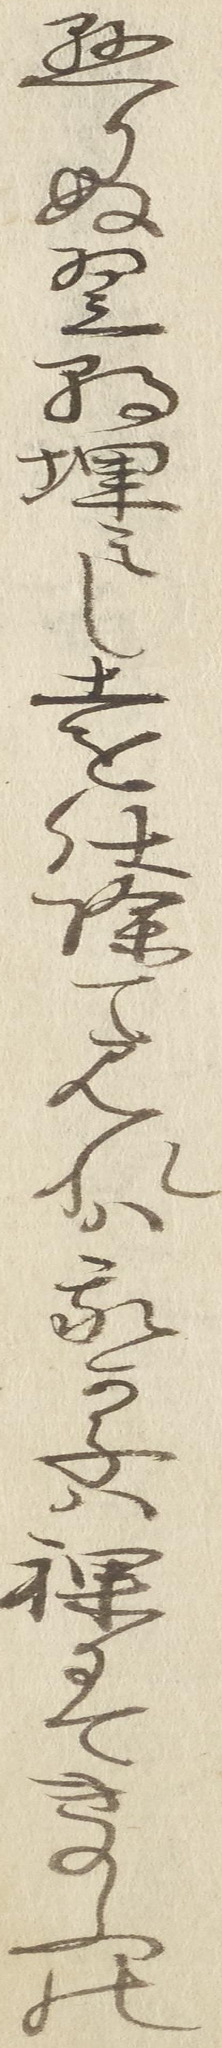懸りぬ翌朝埋みし土を仕除て見れは我か子は裸にてきのふの
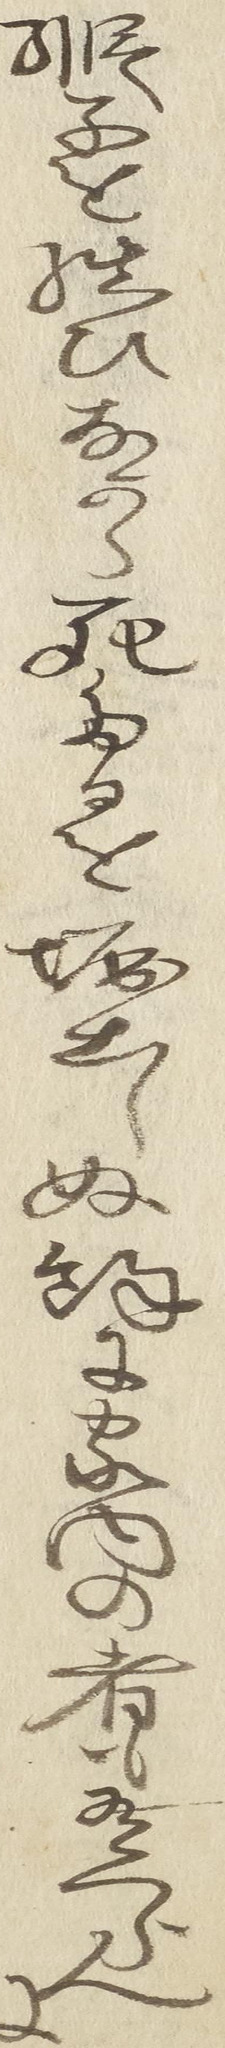緞子を結ひ死たるを掘出しぬ余に家内の者も有つらんに
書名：地震記　上
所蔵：東京大学地震研究所図書室 Earthquake Research Institute Library, The University of Tokyo, JAPAN
